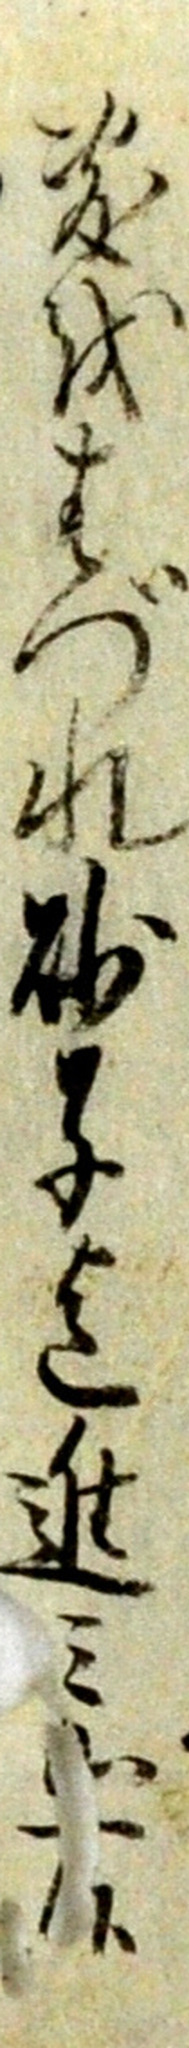敷をはづれ砂子迄進ミ出候
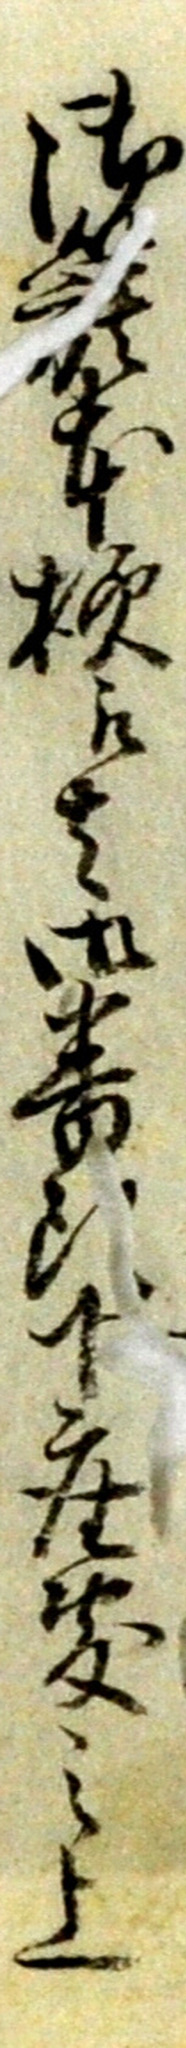御籏本様江者御番頭下座敷之上
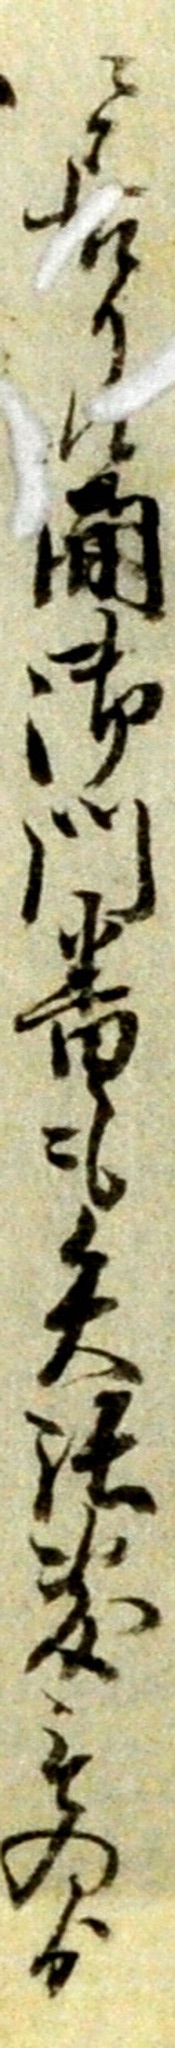ニ居り候間御門番も矢張敷ものゟ
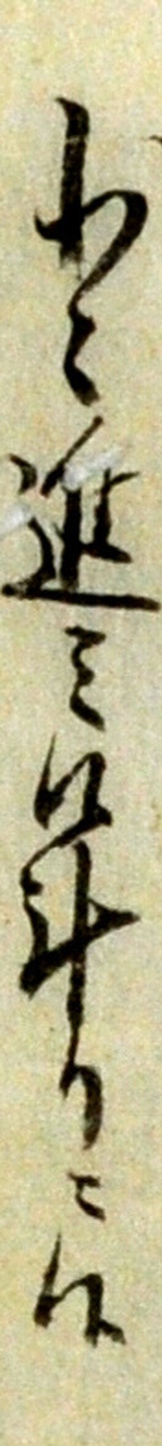少々進ミ候斗りニ候
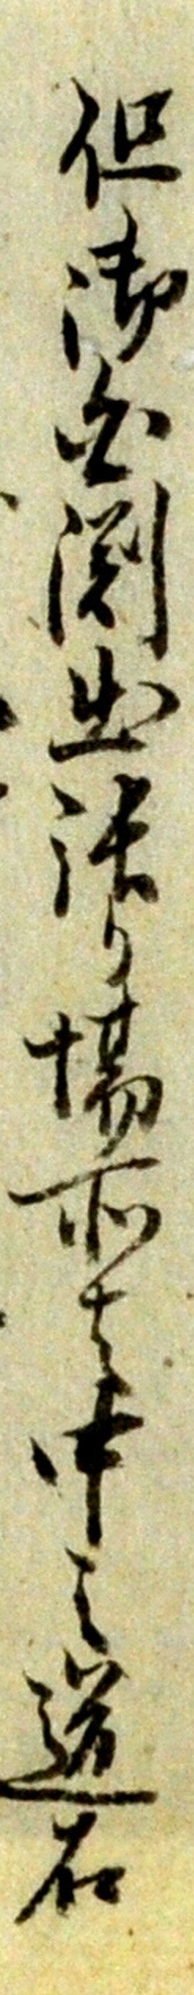但御白渕出張り場所者中之道石
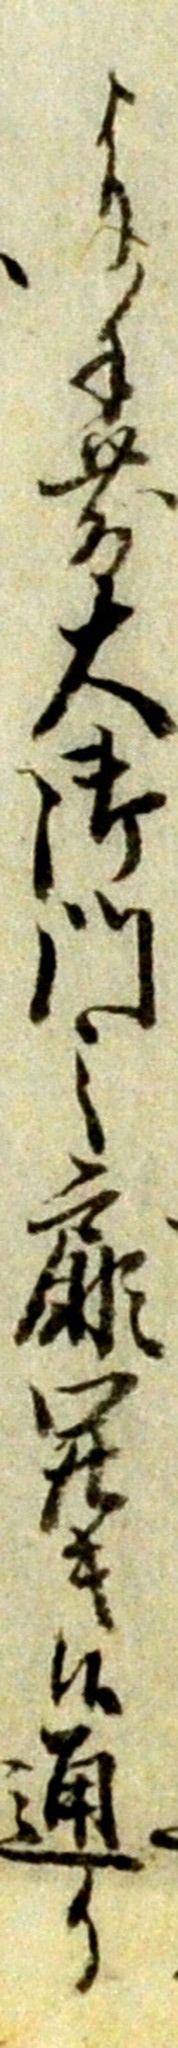より手前大御門之扉開キ候通り
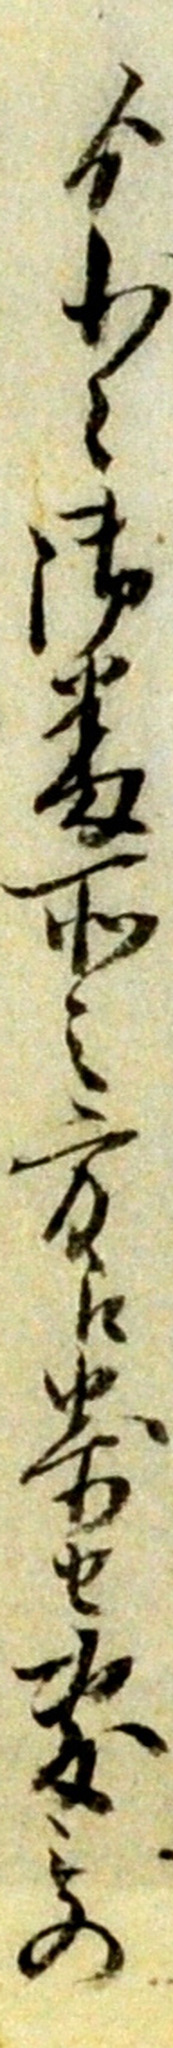ゟ少々御番所之方江寄セ敷もの
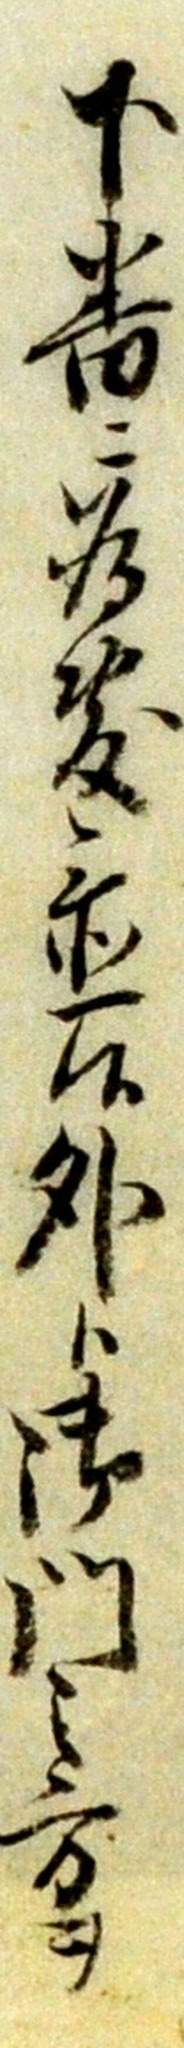下番ニ為敷置候外ト御門之方ヲ
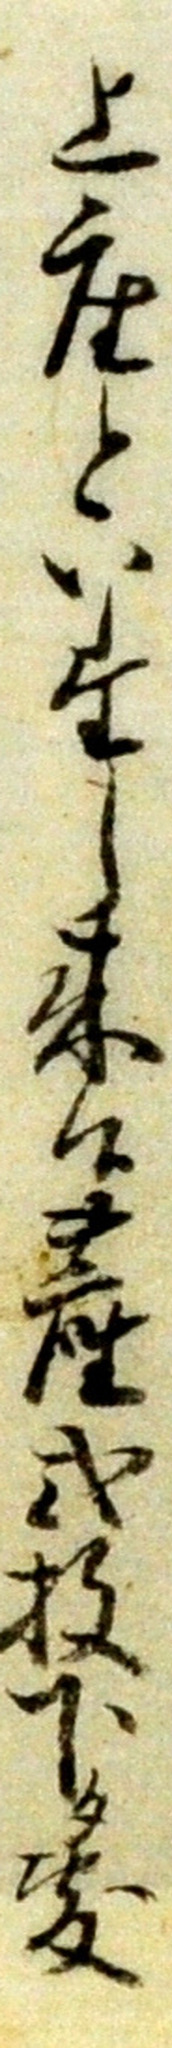上座といたし来候御座弐枚下タ敷
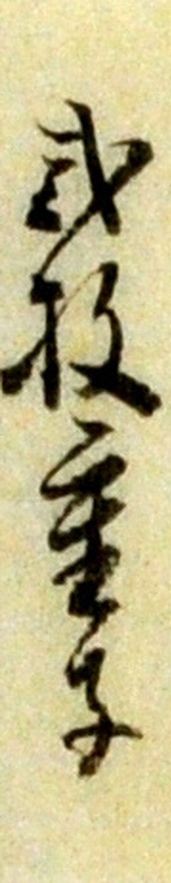弐枚金子
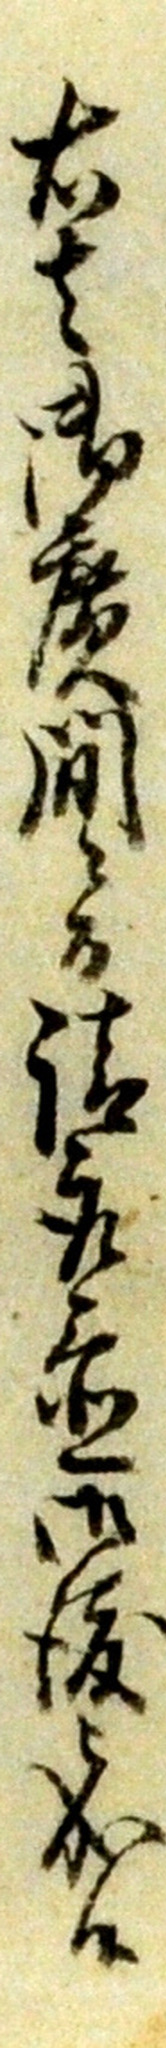右者御広間ニ而請取置御渡被成候
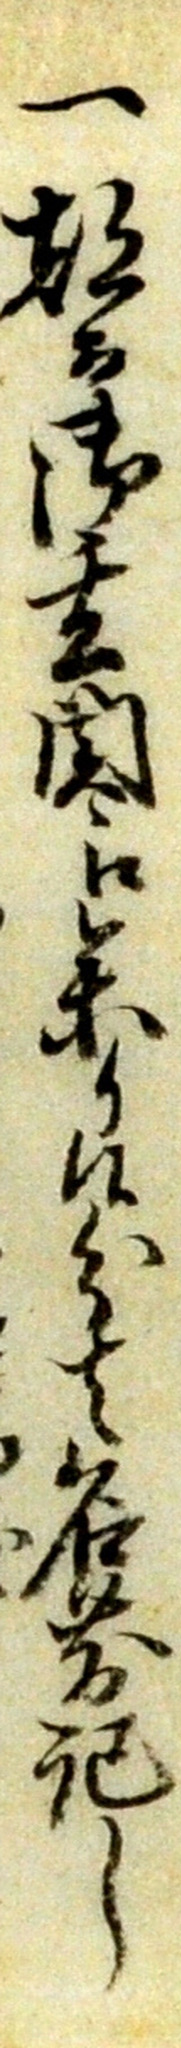一都而御玄関江参り候分者名前記し
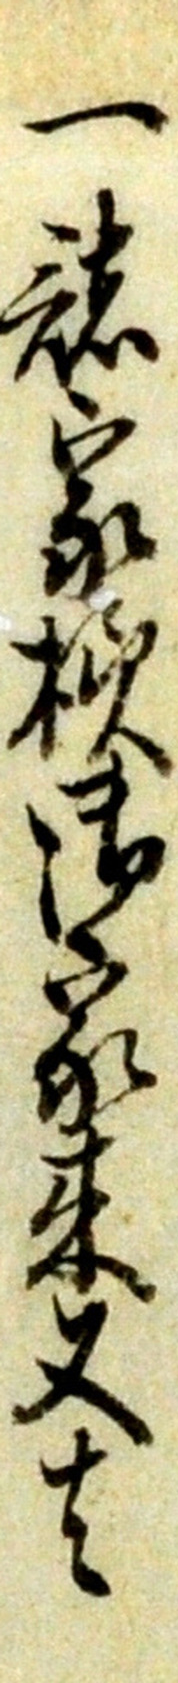一諸家様御家来又者
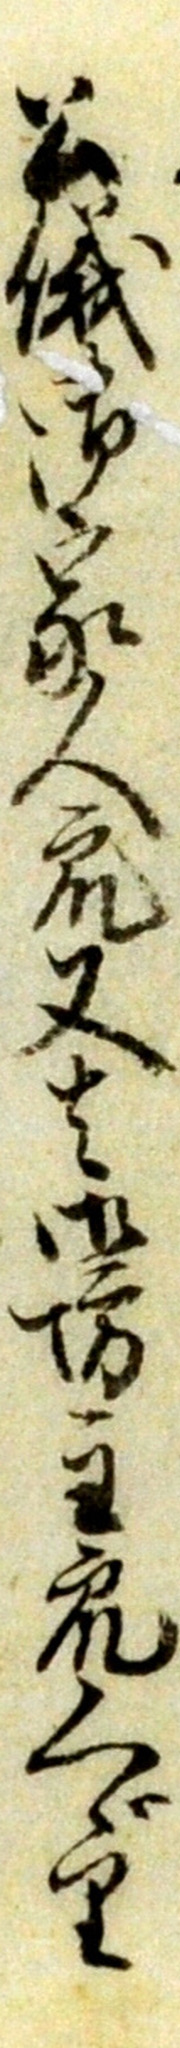公儀御家人衆又者御坊主衆くぐり
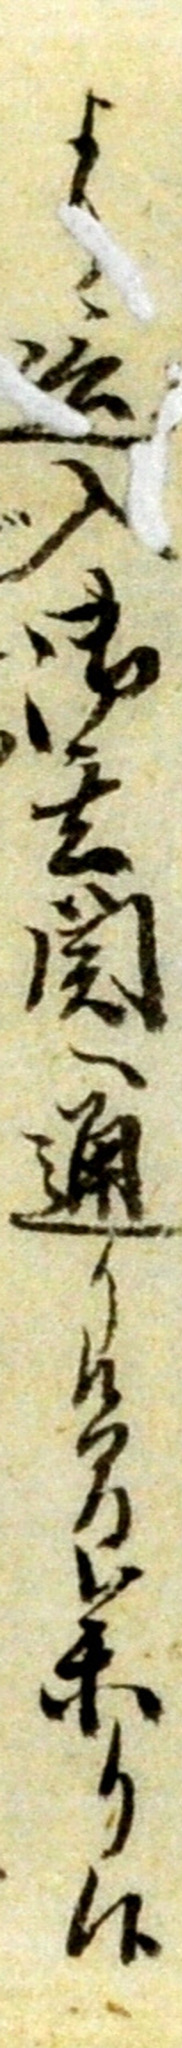より這入御玄関へ通り候間参り候
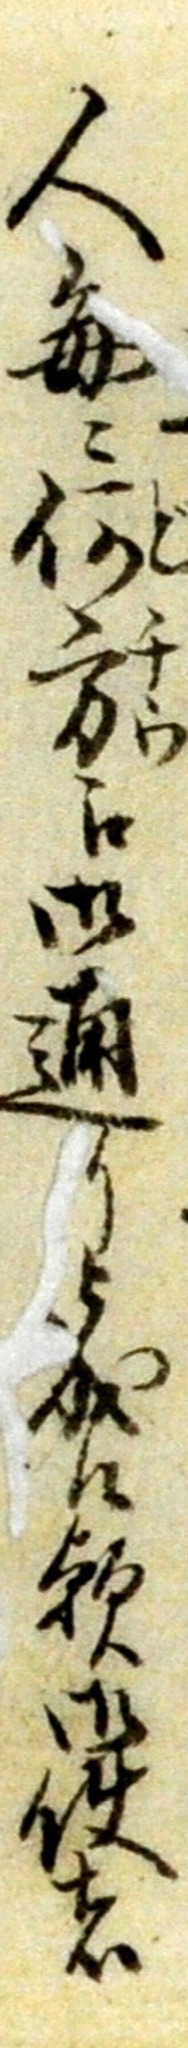人毎ニ何方江御通り被成候歟御使者
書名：御先手組江戸御屋敷御門番勤方
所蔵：伊那市立高遠町図書館・合同会社AMANE
